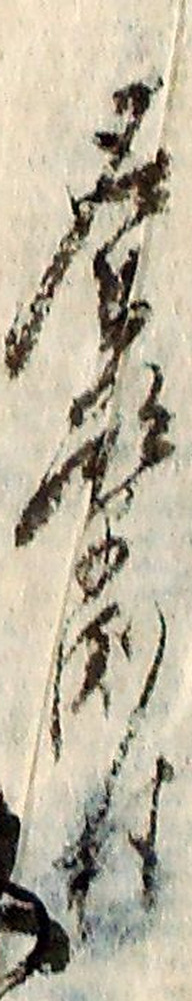名東郡早淵村
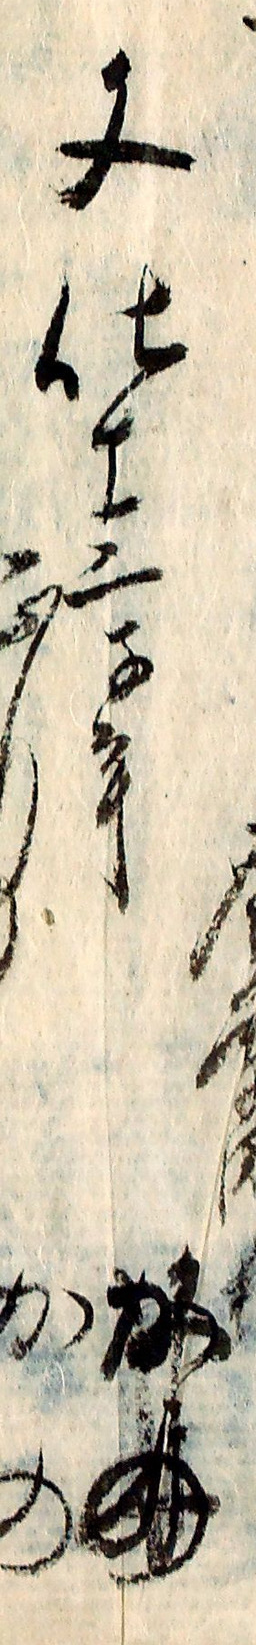文化十三子年かの
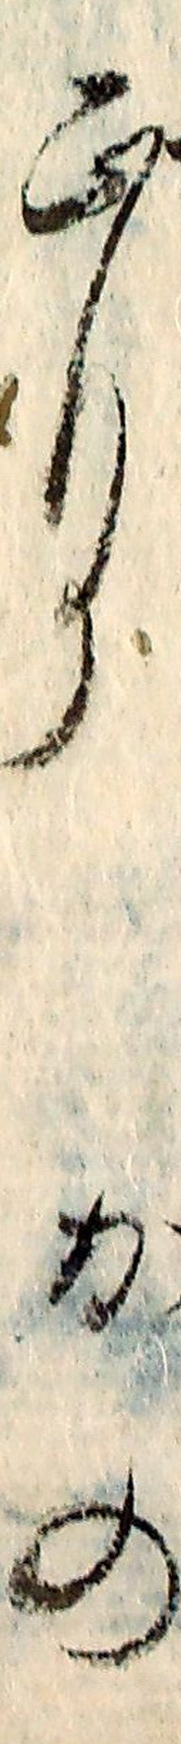正月かの
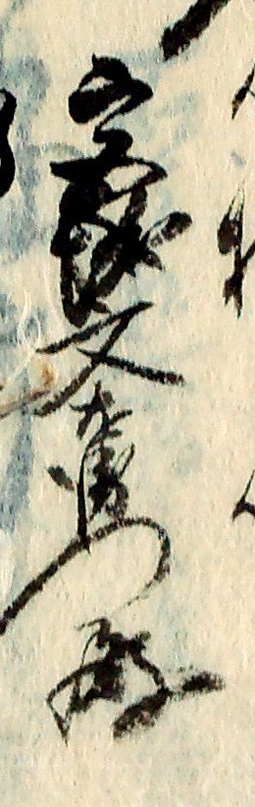宮城文右衛門殿
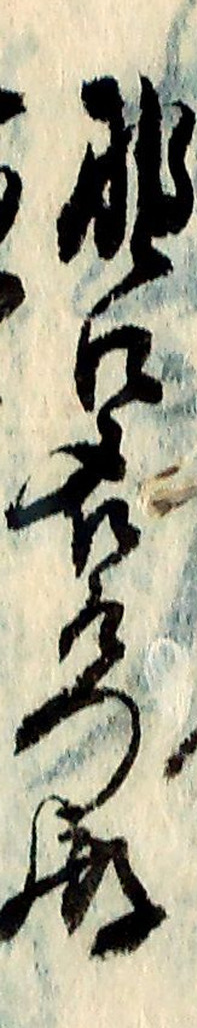野口名左衛門殿
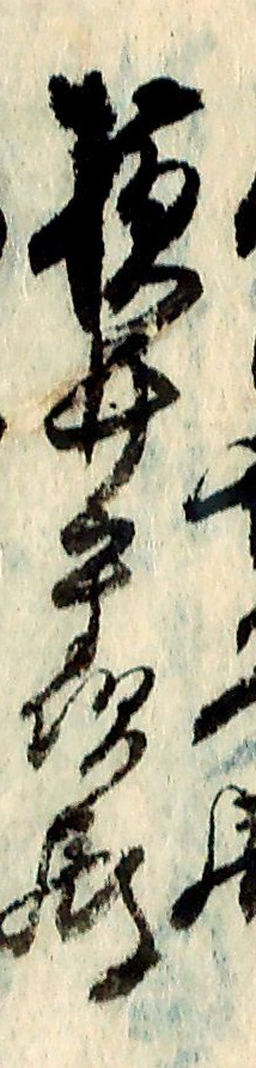横井守次殿
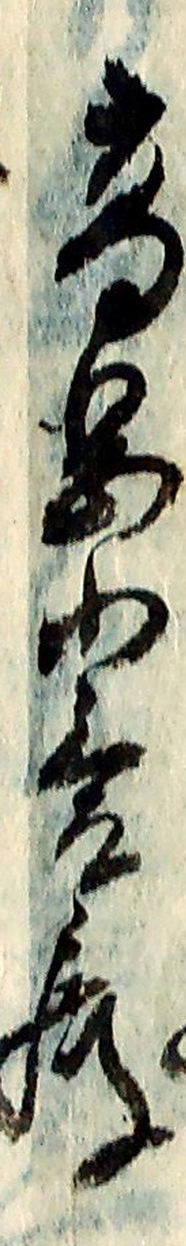高島小三太殿
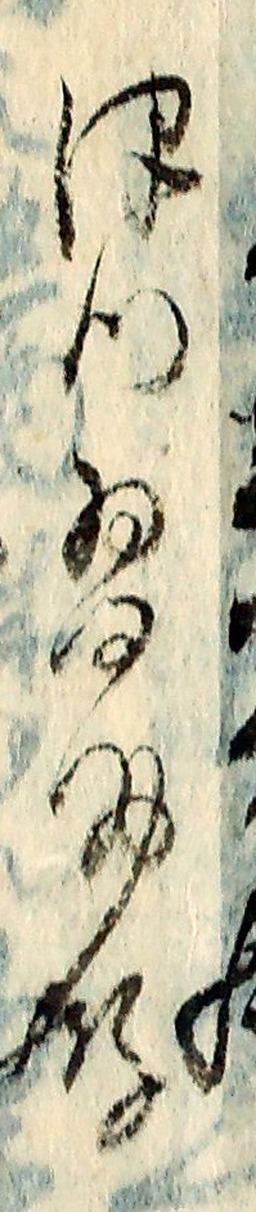津川羽田助殿
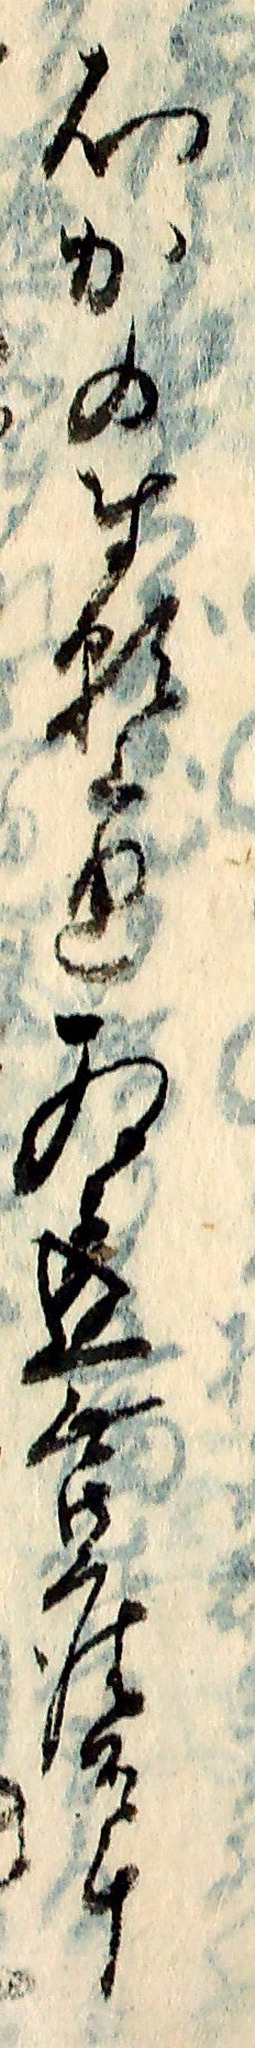右かの奉願上通相違無御座候に付
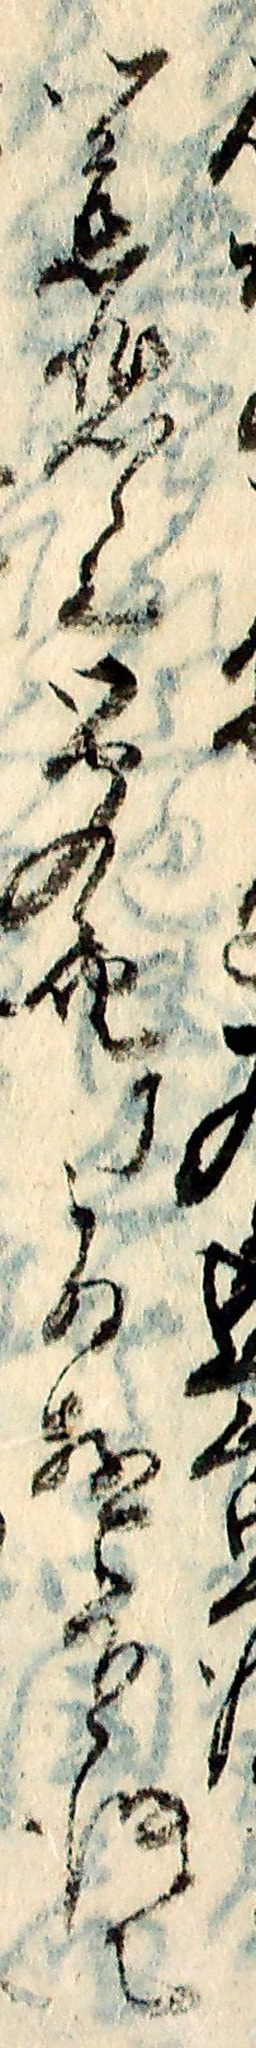御慈悲之上御聞届け被為遊被下候得は
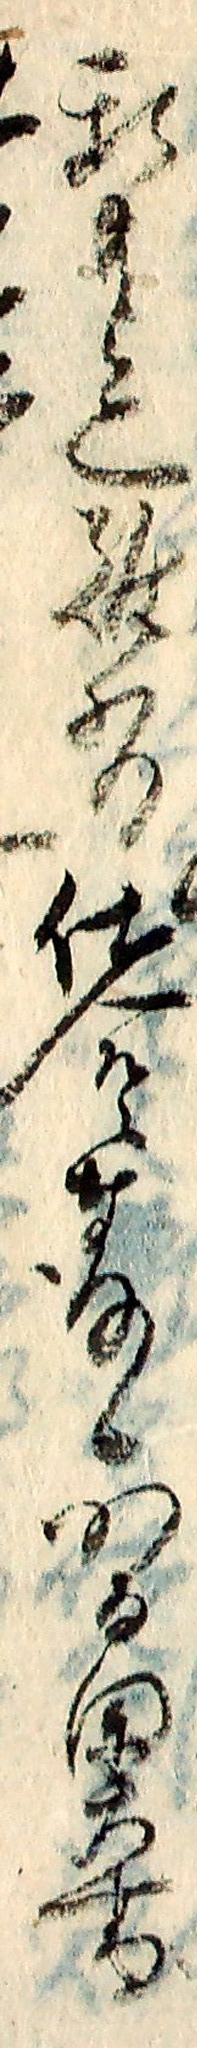私共迄難有仕合に奉存候仍て奥書
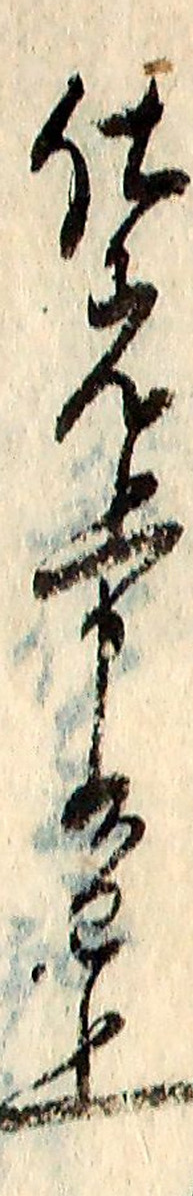仕差上申候已上

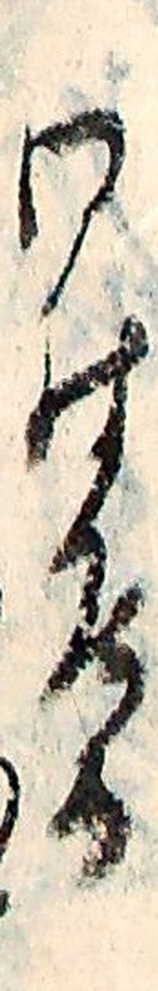同村庄屋
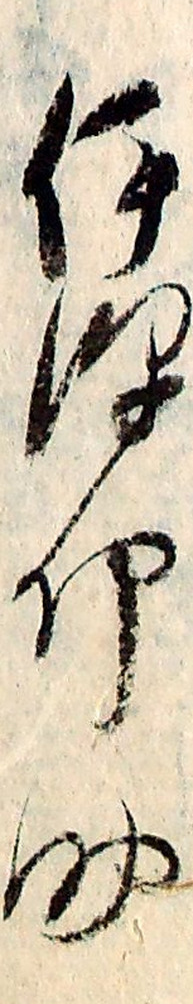伊沢仲助
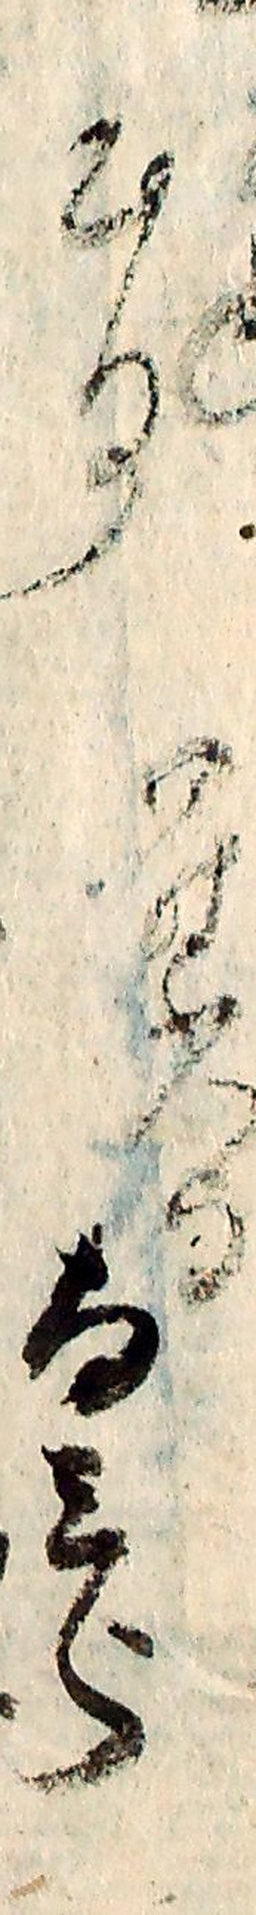正月与三郎
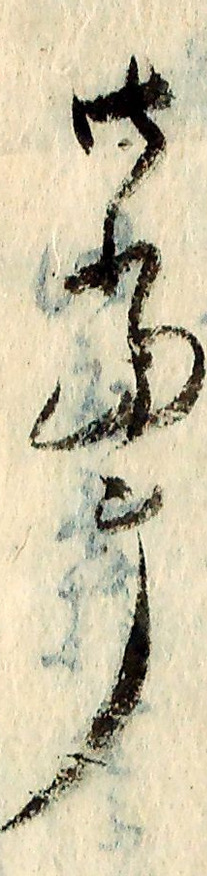御当て
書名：諸御願書控(後藤氏壱番）
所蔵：鳴門教育大学 Naruto University of Education
